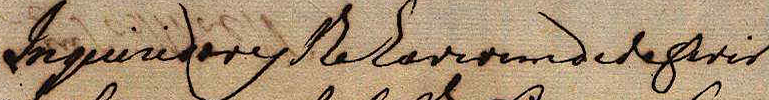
Inquizidores lhe haverem de deferir
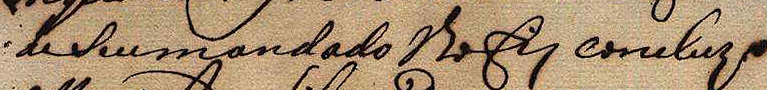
de Seu mandado lho fis concluzo
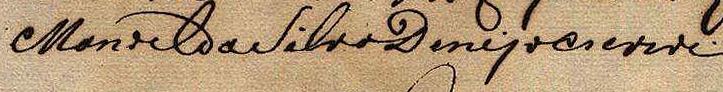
Manoel da Silva Denis o escrevi.
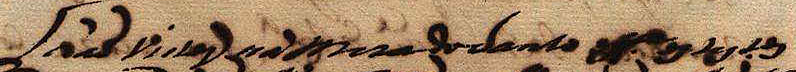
Foraõ vistos na meza do Santo off.o as tes.tas
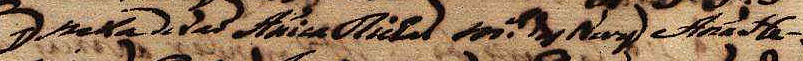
q̄ nella deraõ An̄ica Richar m.el das Neves e An̄a He
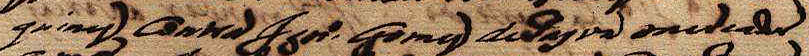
quines contra Jgn.o Gomes de Payva mercador
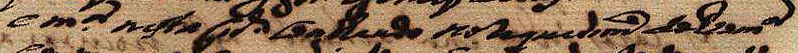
e m.or nesta Cid.e contheudo no Requerim.to do Promor
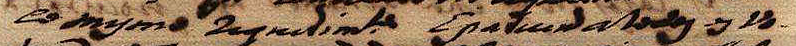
e o mesmo Requerim.to E parecendo todos os vo
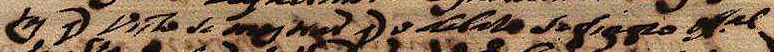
tos q̄ visto se mostrar q̄ o delato se fia no off.al
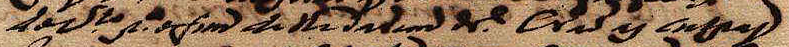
do S.to p.a o fim de lhe darem dr.o eraõ as culpas
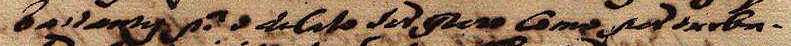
bastantes p.a o delato ser prezo como perturba
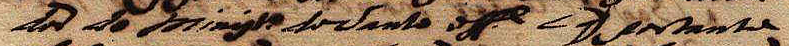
dor do minist.o do Santo off.o e q̄ portanto
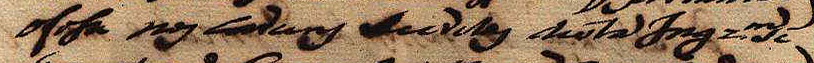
o fosse nos carceres secretos desta Inqz.m sē
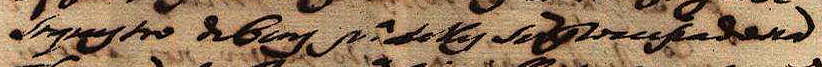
sequestro de bens p.a delles ser pRocessado na
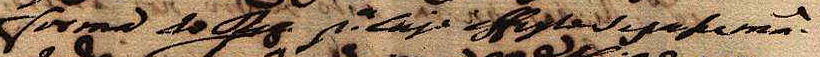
forma do Reg. p.a cujo effeyto se passe mā
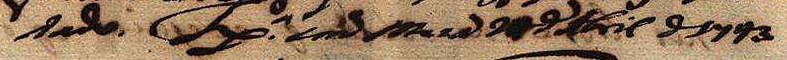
dado. Lx.a em Meza 20 d̄ Abril d̄ 1743
